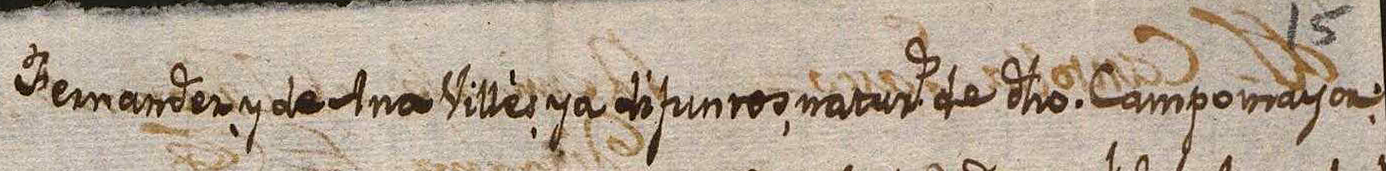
Fernandez, y de Ana Villés, ya difuntos, natur.s de dho. Campo mayor
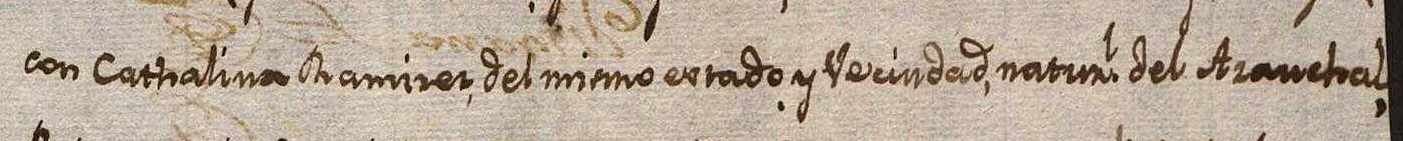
con Cathalina Ramirez, del mismo estado, y Veciudad, natur.l del Azauchal,
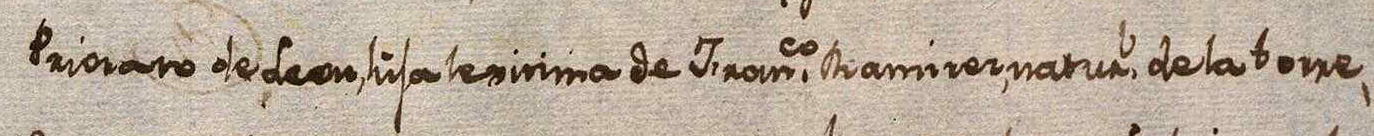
Priorato de Leon, hija lexitima de Fran.co Ramirez, naturl, de la torre,
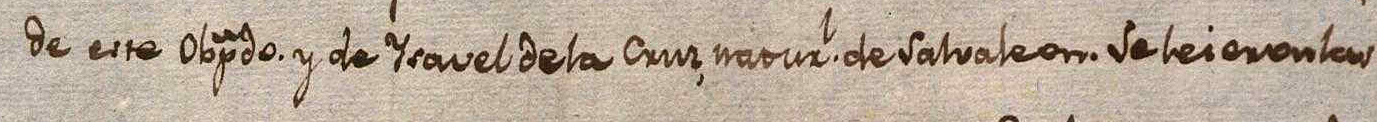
de este Obp̄do. y de Isavel dela Cruz, naturl. de Salvaleon. Se heieron las
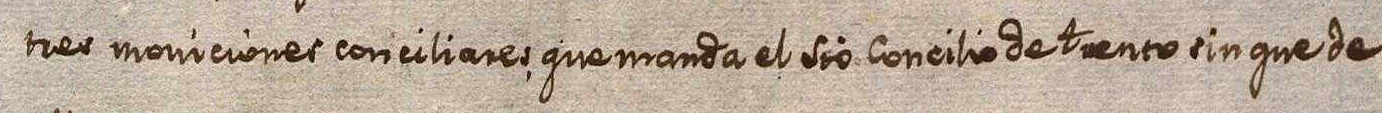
tres moniciones conciliares, que manda el Stō Concilio de Trento sin que de
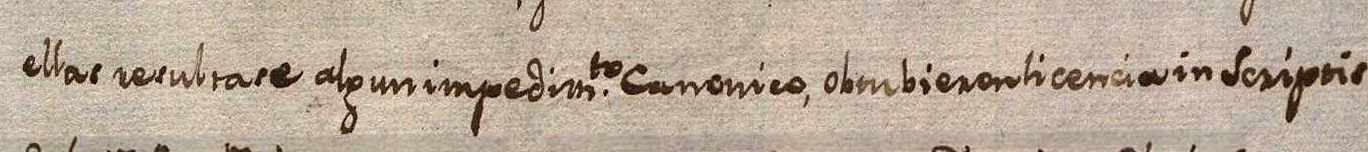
ellas resultase algun impedim.to Canonico, obtubieron licencia in Scriptis
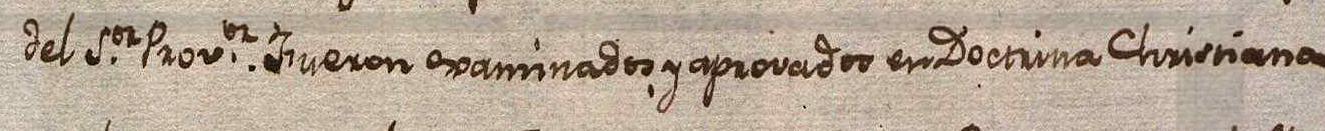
del S.or Prov.or. Fueron examinados, y aprovados en Doctrina Christiana
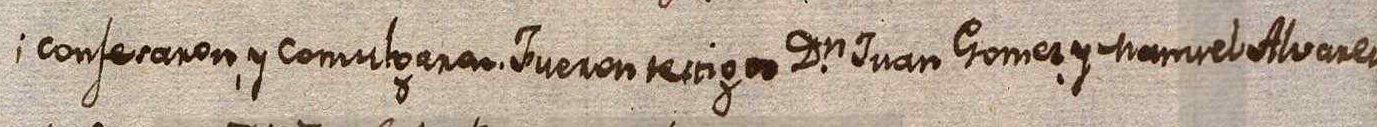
i confesaron, y comulgaron. Fueron testigos D.n Iuan Gomez, y Manuel Alvarez
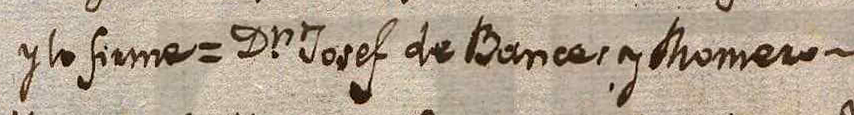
y lo firme = D.n Iosef de Bances, y Romero
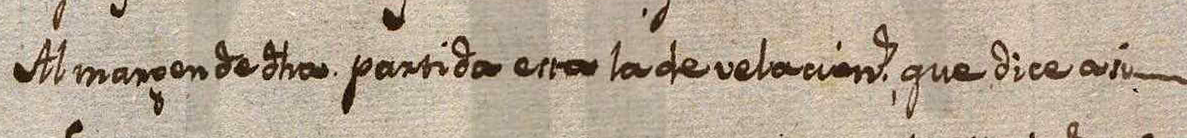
Al margen de dha. partida esta la de velacion.s que dice asi
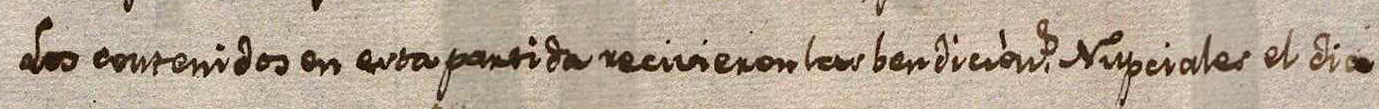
Los contenidos en esta partida recivieron las bendición.s Nupciales el dia
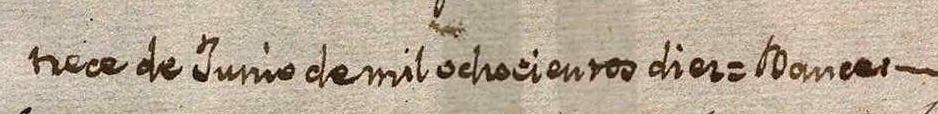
trece de Iunio de mil ochocientos diez = Bances
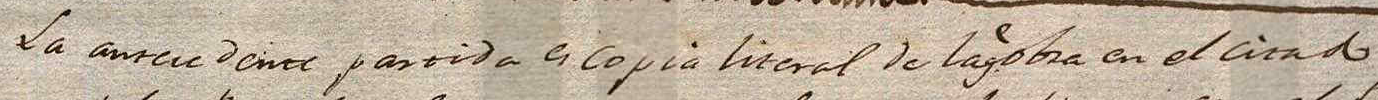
La antecedente partida es copia literal de la q.e obra en el citado
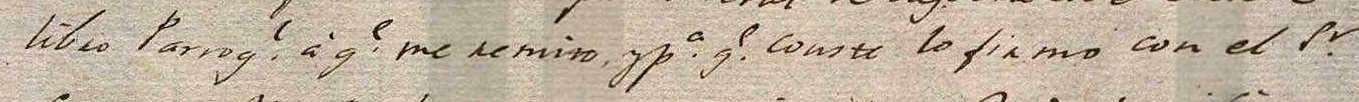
libro Parroq.l à qe. me remito, y p.a q.e conste lo firmo con el S.r
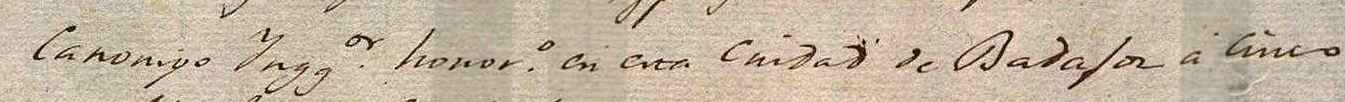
Canonigo Ynqq.or honor.o en esta Ciudad de Badajoz a cinco
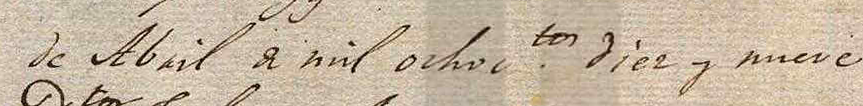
de Abril de mil ochoc.tos diez y nueve
